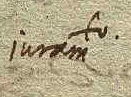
iuramto.
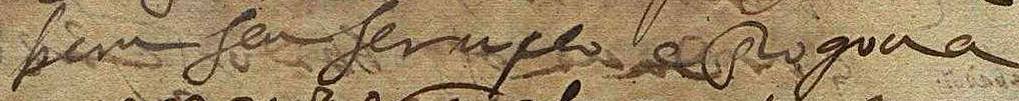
bem seu serujço e Rogou a
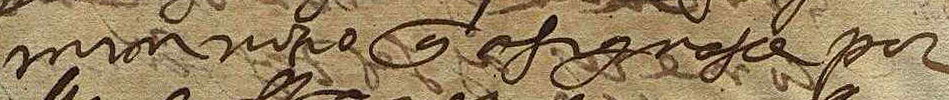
mim notro q̄ asignasse por
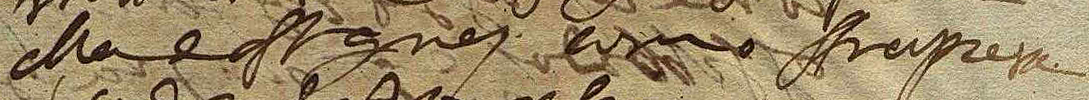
ella e assignej com o Arcipreste
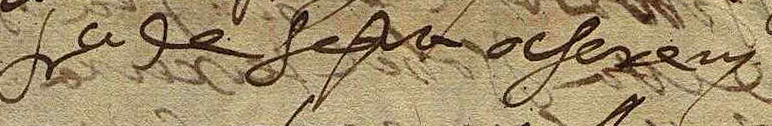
frco de seqra o escreuj
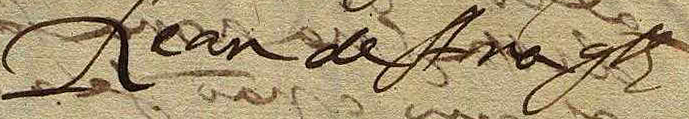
Rcam de Anna gll̄z
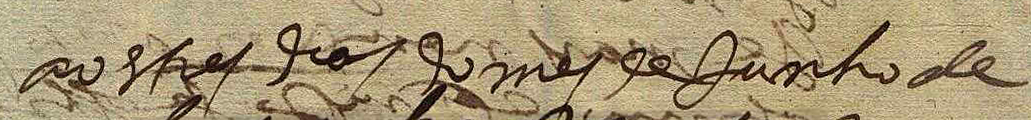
aos tres dias do mes de Junho de
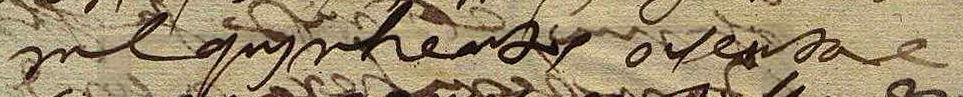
mil qujnhentos oitenta e
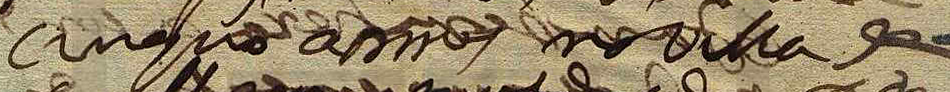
cinquo annos na villa de
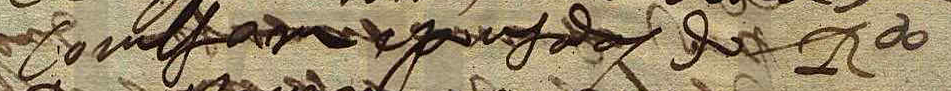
Couilham e pousadas do Rdo
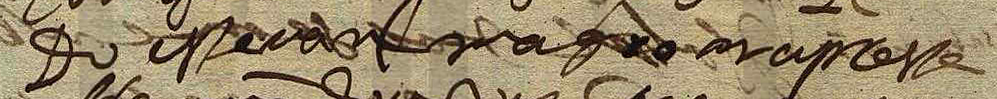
Dr esteuam magro arcipreste
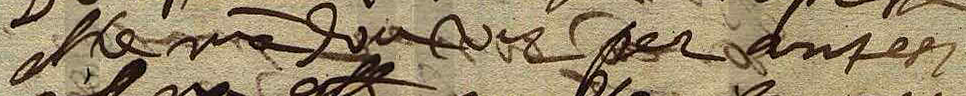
elle mādou vir perante sj
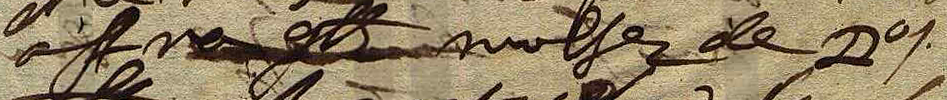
a Ana gl̄lz molher de Dos.
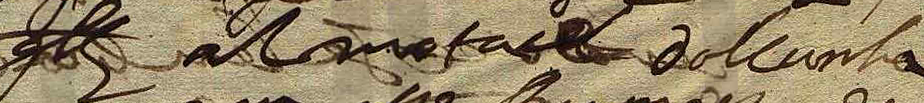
ḡllz almotacel dalcunha
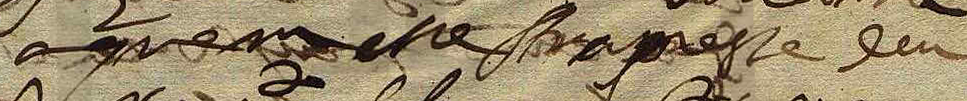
a quem elle Arcipreste deu
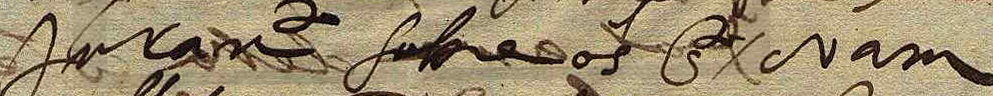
Juramto sobre os stos evam
